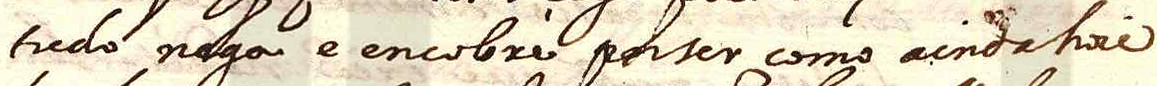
tudo nega e encobre por ser como ainda hoie
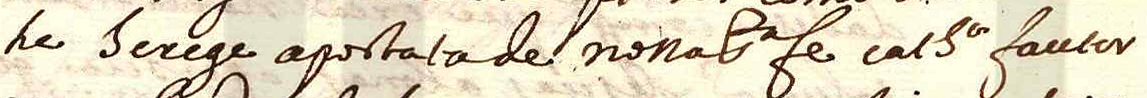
he herege apostata de nossa sta fe catha fautor
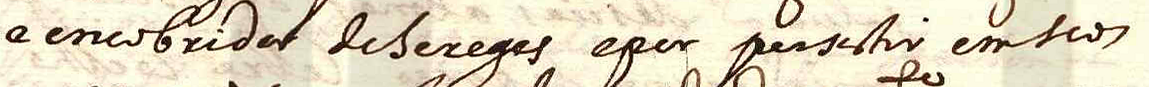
e encobridor de hereges e por persestir em seos
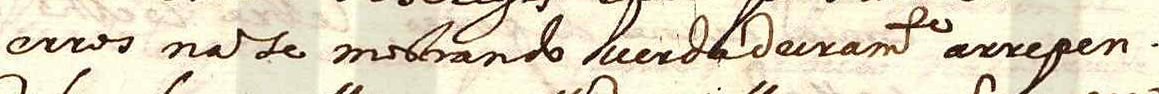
erros nā se mostrando uerdadeiram.te arrepen
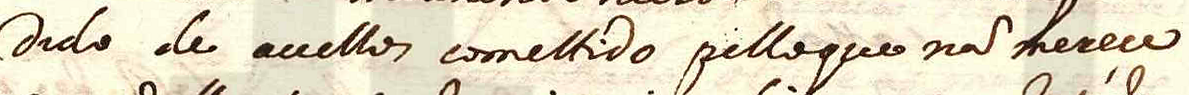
dido de auellos comettido pello que naõ merece
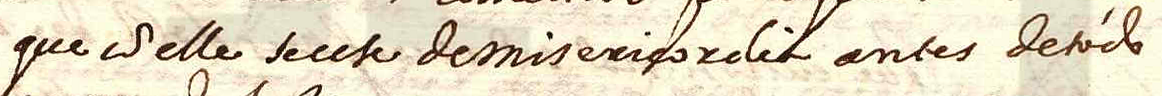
que cō elle se use de misericordia antes de todo
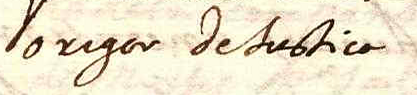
o rigor de Iustiça
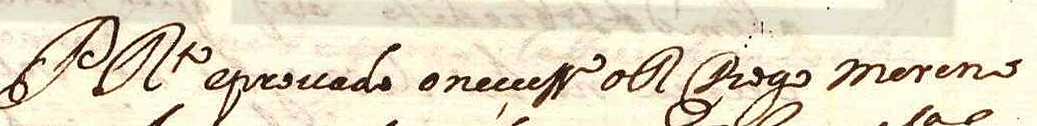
P Rto e prouado o neccesso o R Diogo moreno
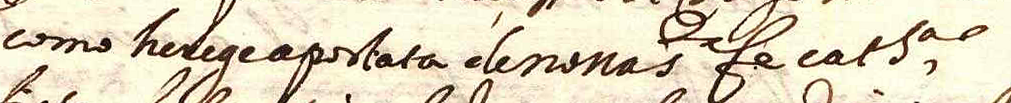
como herege apostata de nossa sta fe catha
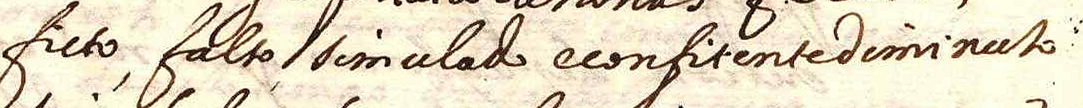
ficto, falso, simulado, e confitente diminuto
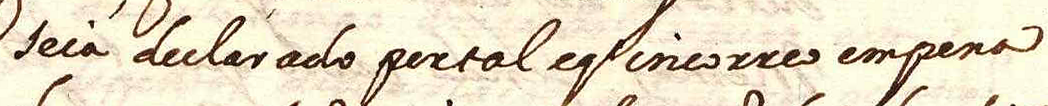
seia declarado por tal e q̄ incorreo em pena
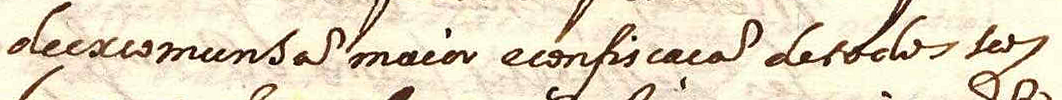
de excomunhaõ maior e confiscaçaõ de todos seos
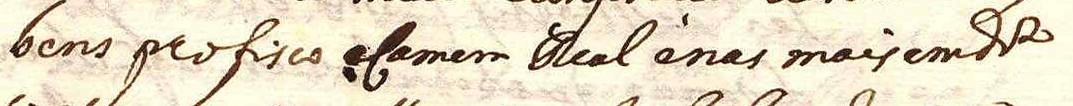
bens pa o fisco e Camera Real e nas mais em drto
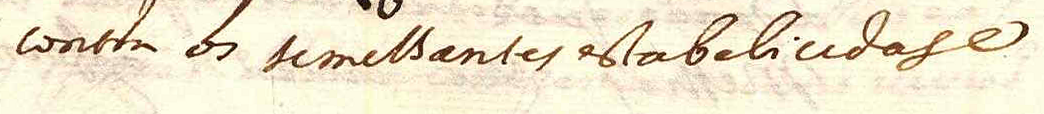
contra os semelhantes estabelicidas e
